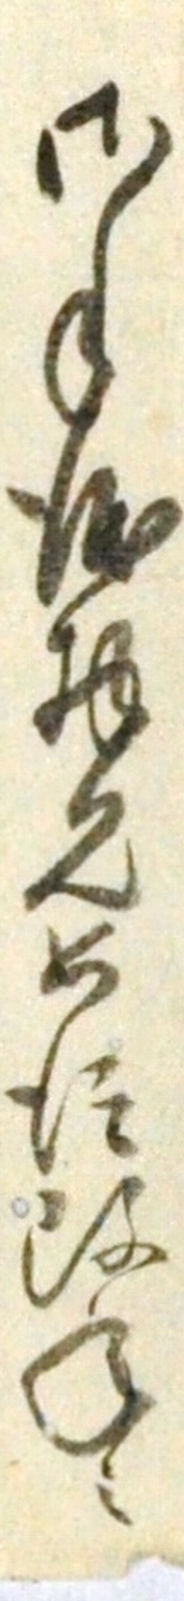御手状拝見如仰改年之
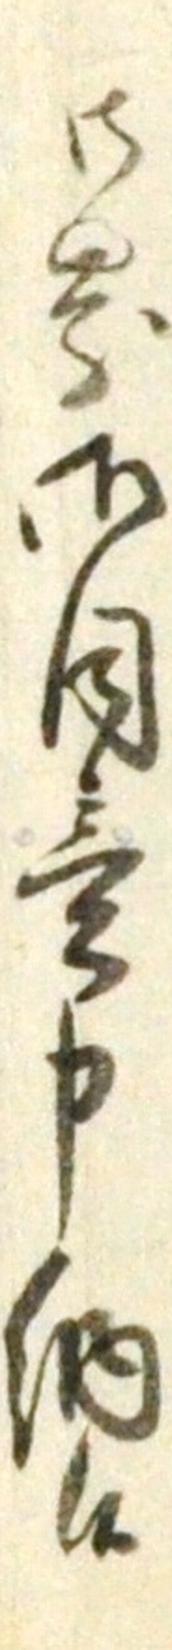御慶御同意申納候
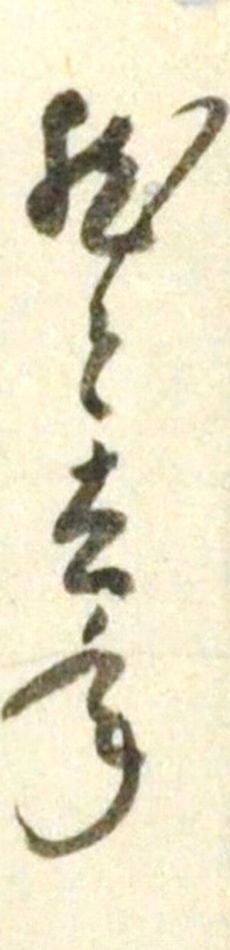然者去年
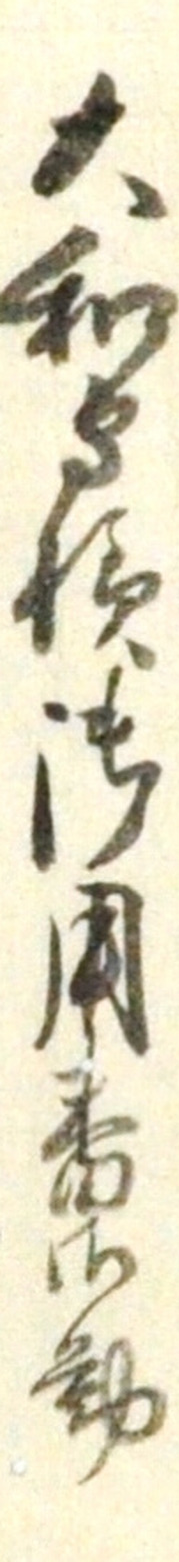大和守様御用番御勤
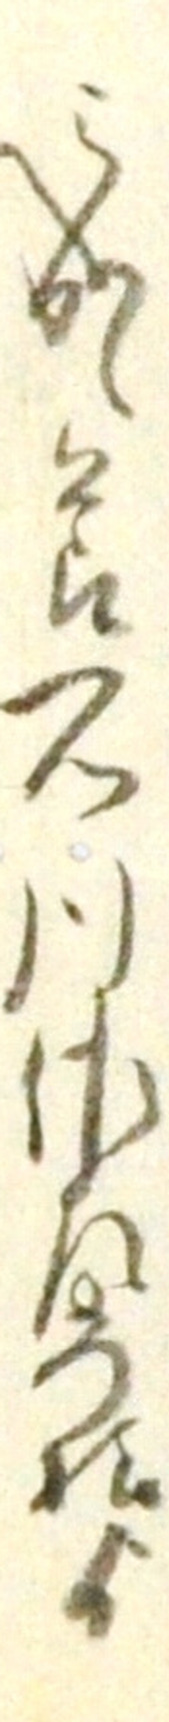被成候節石川佐左衛門様ゟ
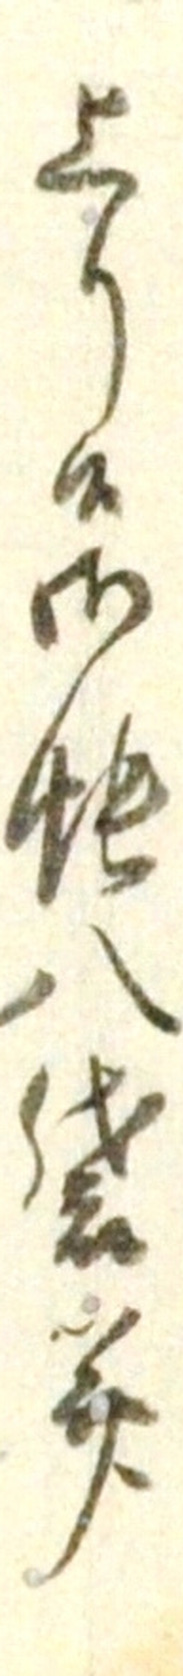上り候御帳八袋并
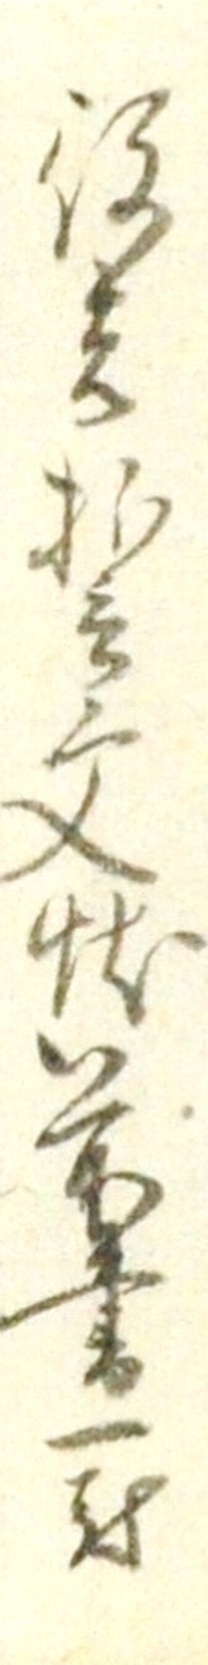役者誓文状前書一封
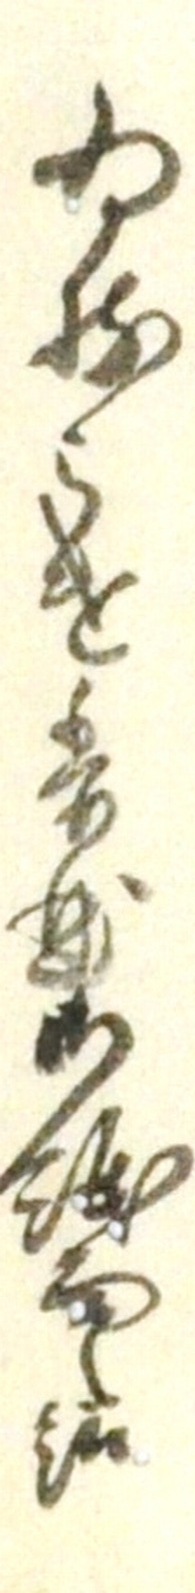為持被遣委曲御紙面之趣
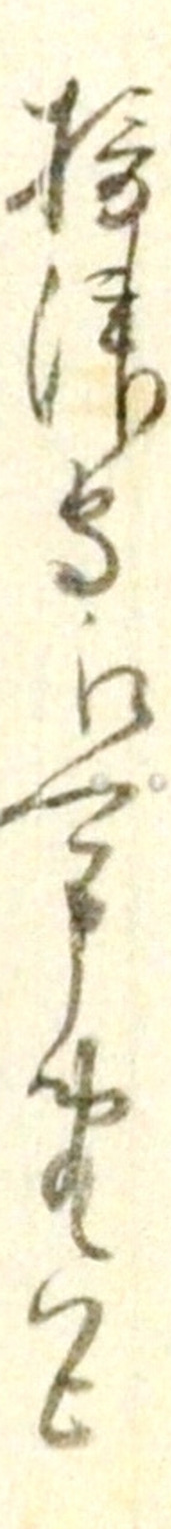摂津守江可申聞候以上
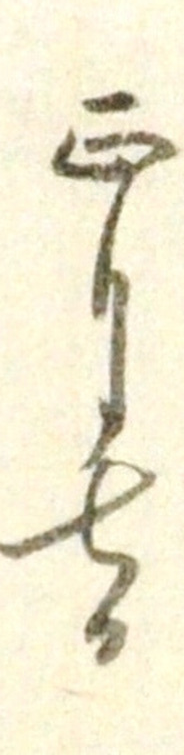正月七日
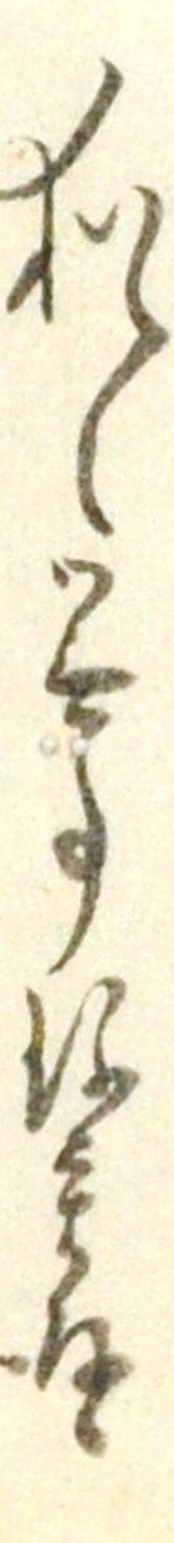猶々御無事珍重存候
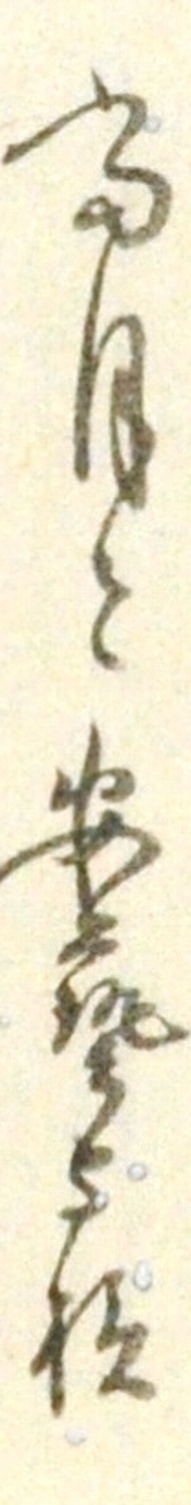当月者安芸守様
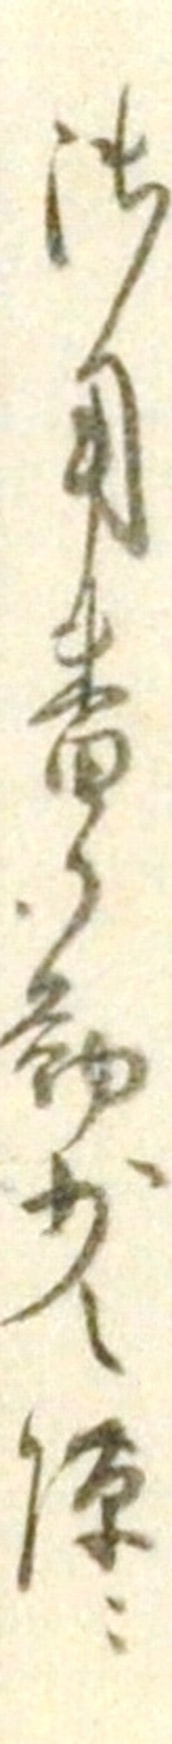御用番御勤少々障ニ

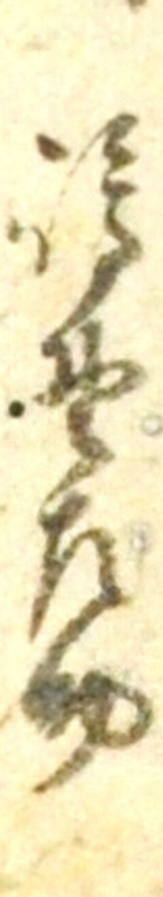嶋野左助
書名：書状
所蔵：伊那市立高遠町図書館・合同会社AMANE
